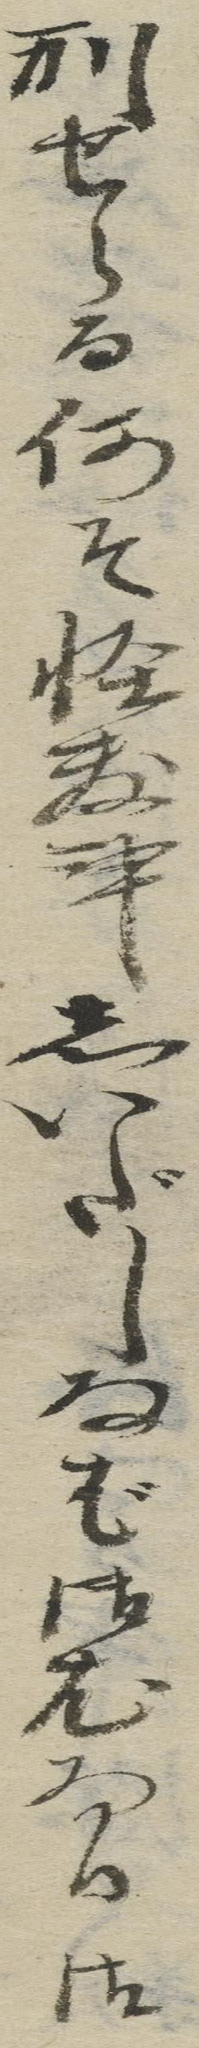刑セらる何そ怪敷事しいだしなば御尤なる御
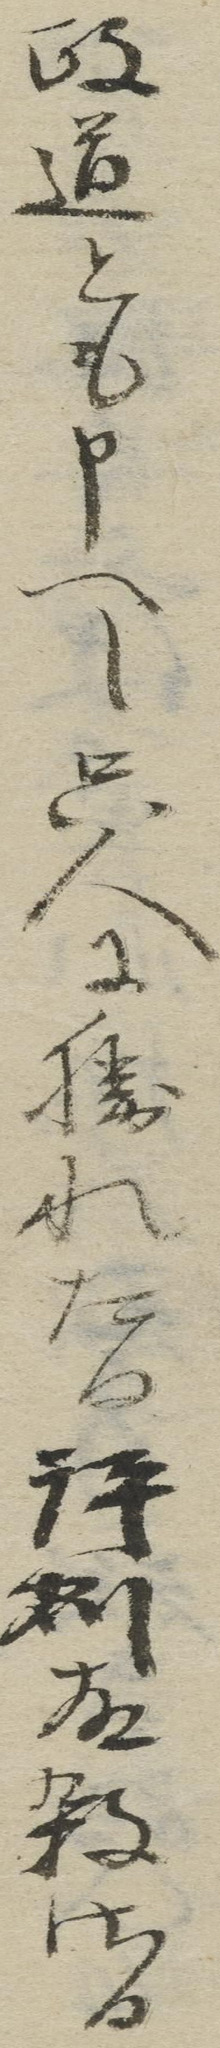政道とも申へし只人に勝れたる評判故殺さる
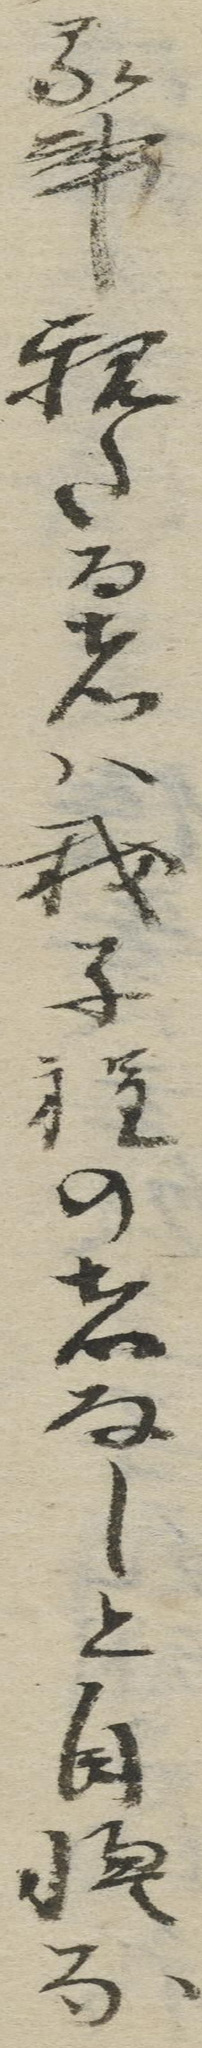る事親たる者は我子程の者なしと自慢な
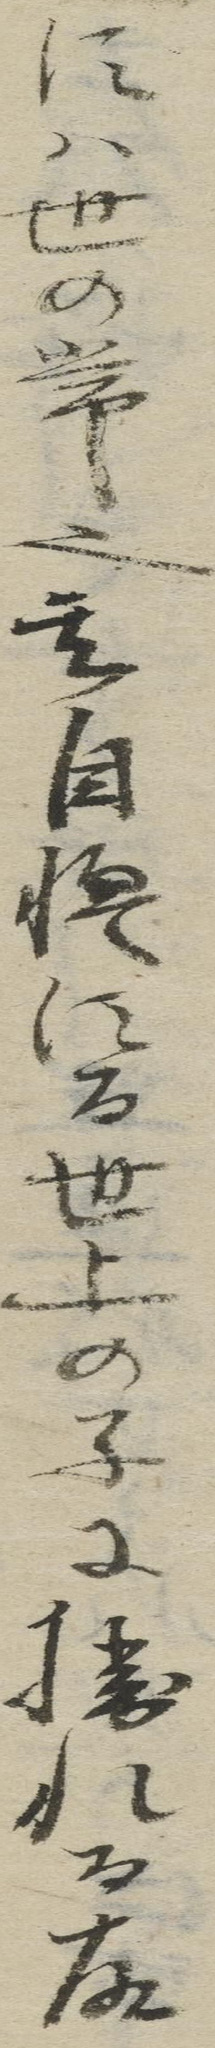すハ世の常也其自慢する世上の子に勝れる故
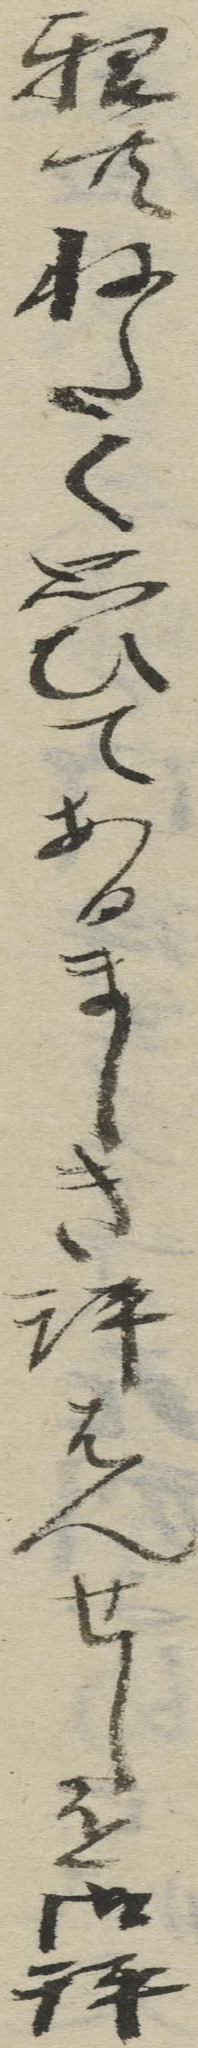親共ねたく思ひてあるましき評はんせしを御評
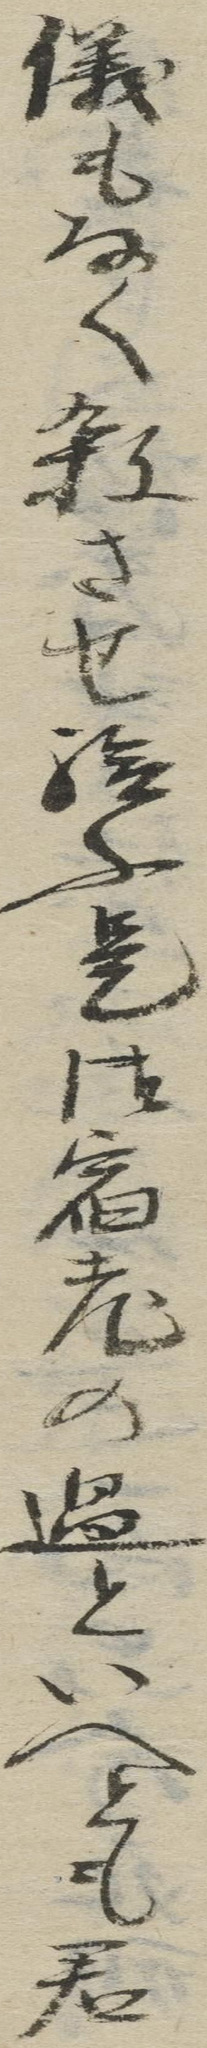儀もなく殺さセ給ふ是御宿老の過といへとも君
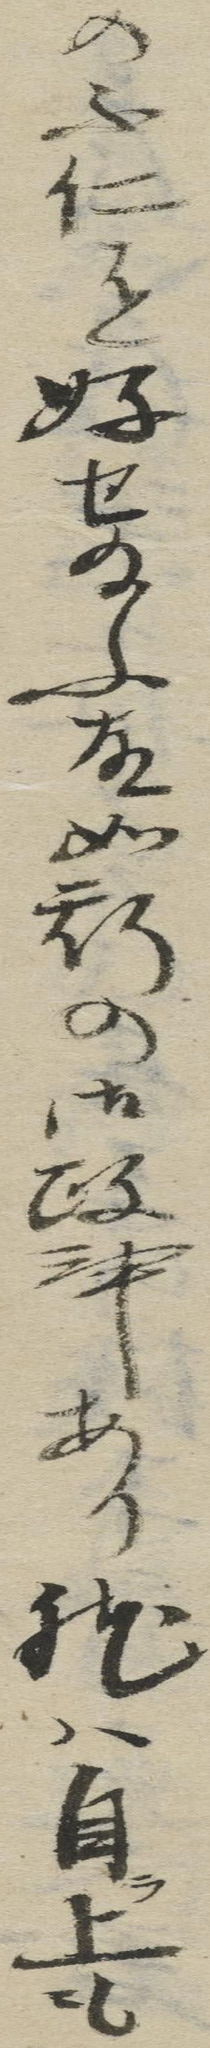の不仁を好セ給ふ故如斯の御政事あり然ハ自ラ上も
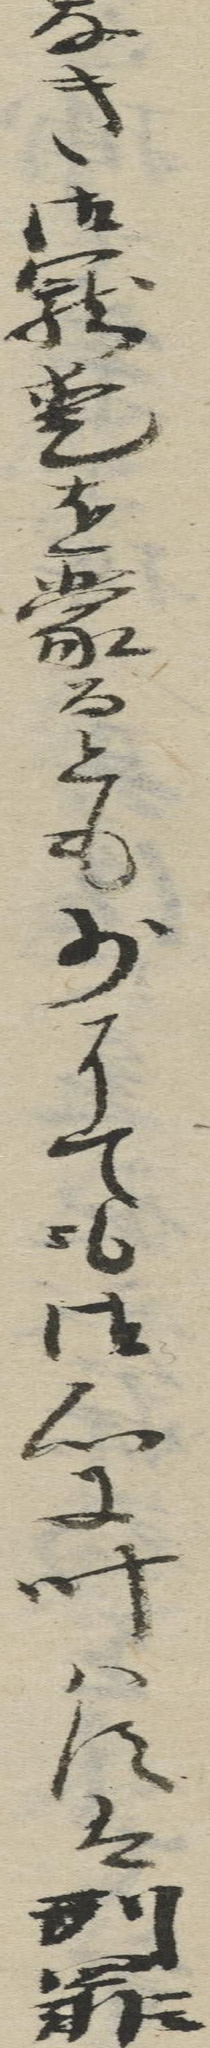なき御寵愛を蒙るとも少にても御心に叶ハすは刑罪
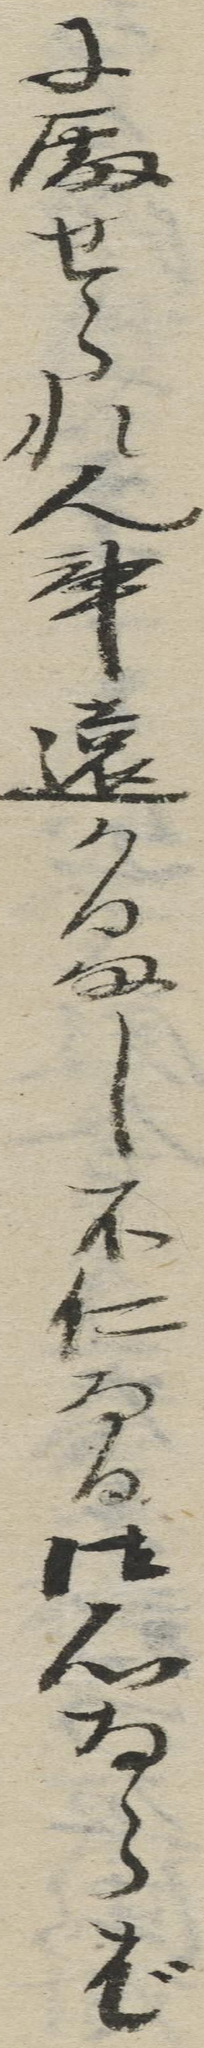に処せられん事遠かるまし不仁なる御心ならば
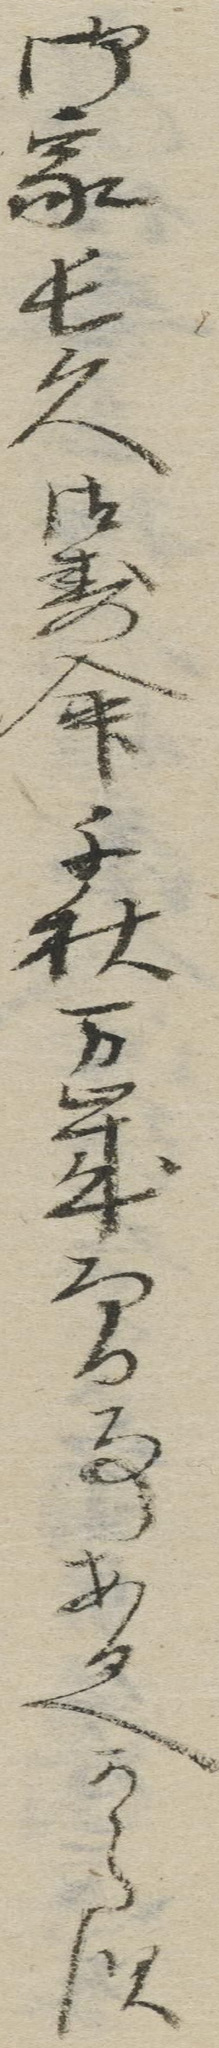御家長久御寿命千秋万歳なる事あるへからす
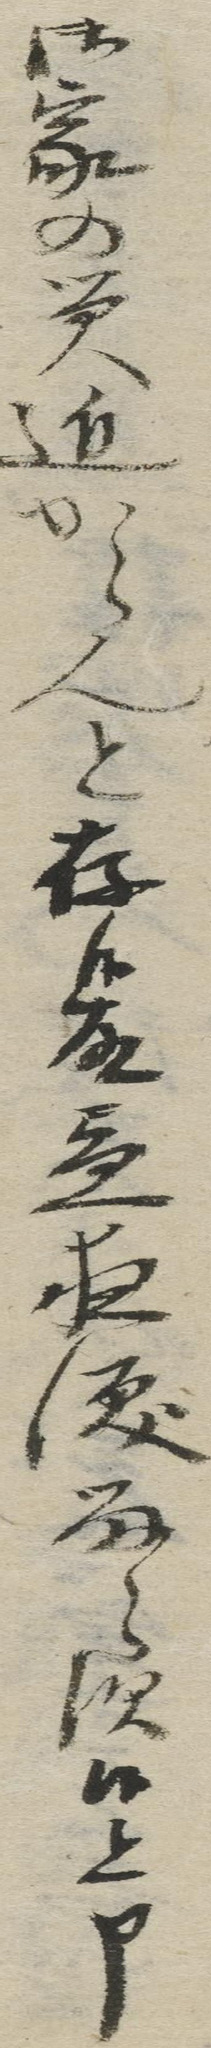御家の災近からんと存候故昼夜便？な？らす候と申
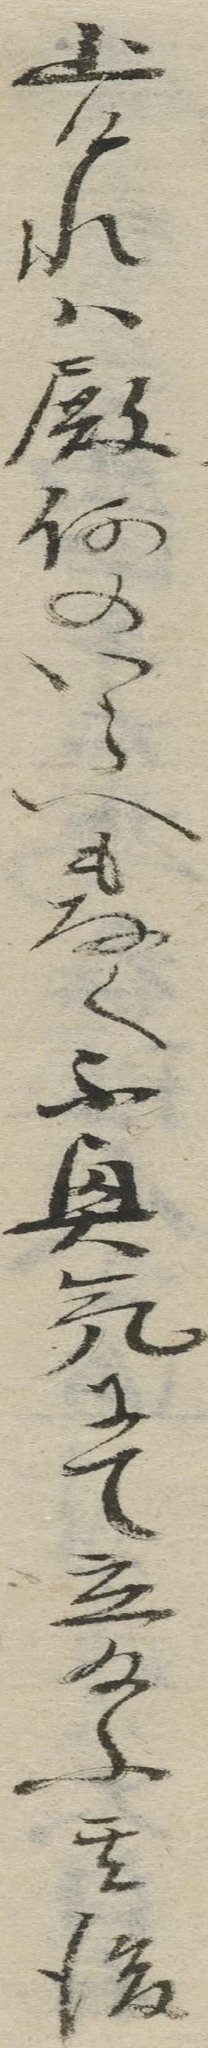上けれハ殿何のいらへもなく不興気にて立給ふ其後
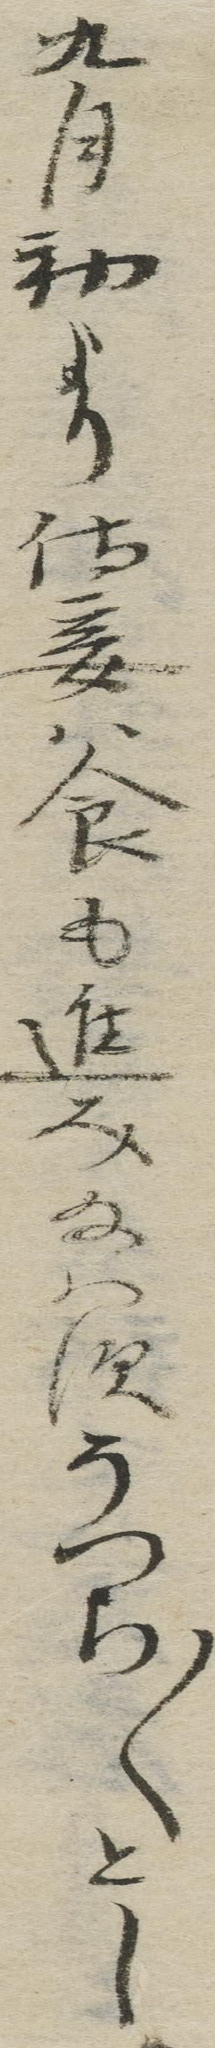九月初より侍妾ハ食も進み給ハすうつら〳〵とし
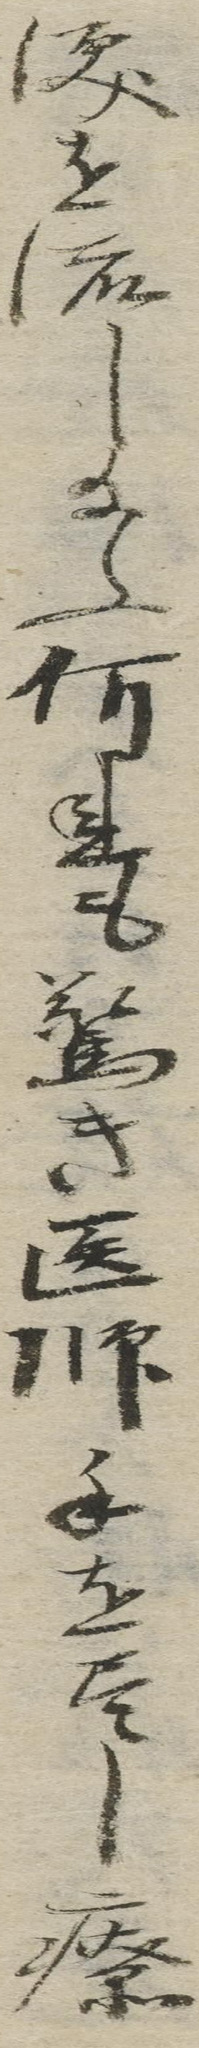涙を流し給ふ何れも驚き医師手を尽し療
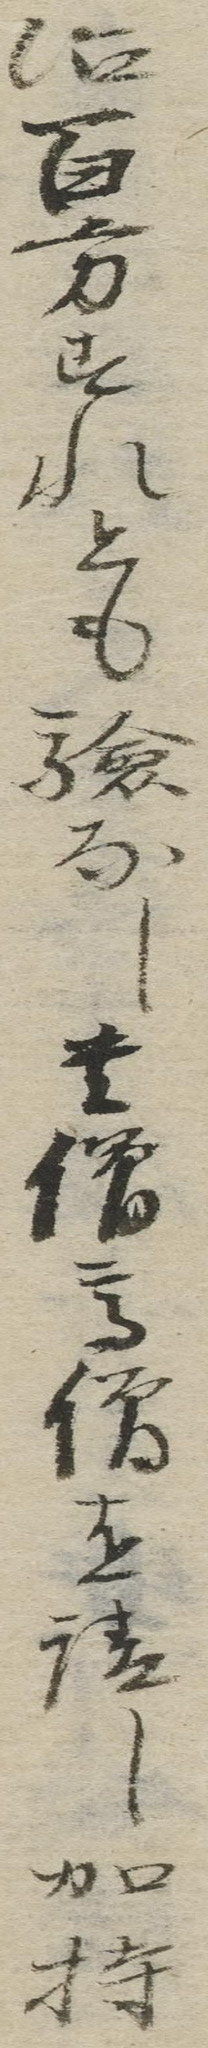治百方すれとも験なし貴僧高僧を請し加持
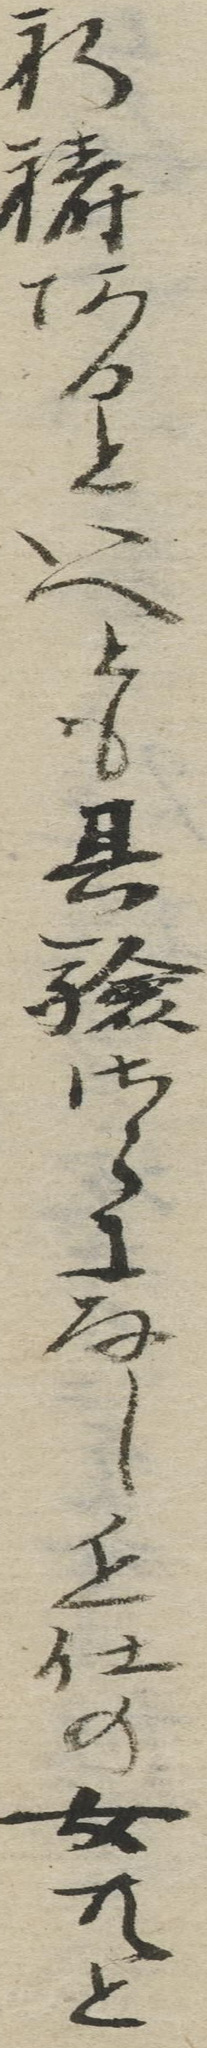祈祷あるといへとも其験さらになし近仕の女共と
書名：肥前國島原領普賢山大変記　完
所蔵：東京大学地震研究所図書室 Earthquake Research Institute Library, The University of Tokyo, JAPAN
